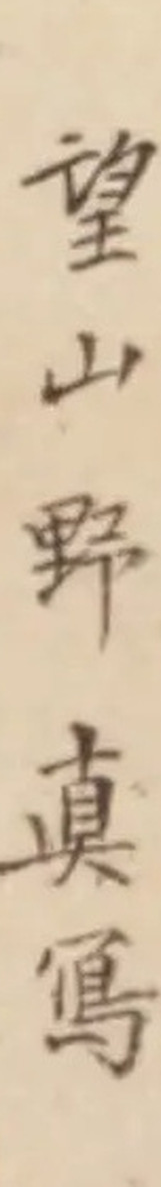望山野真写
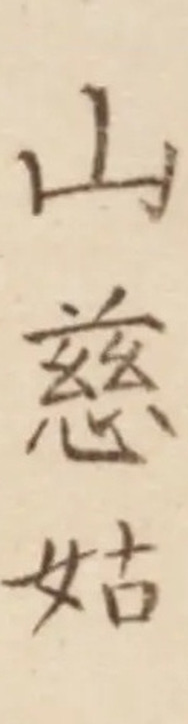山慈姑
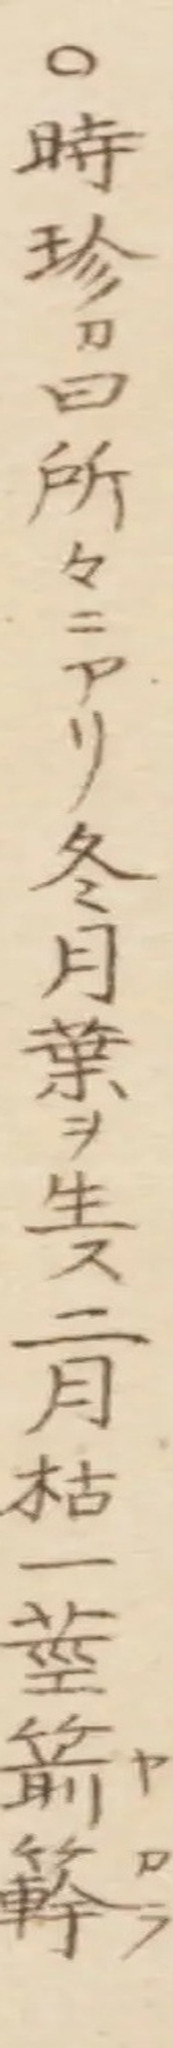○時珍曰所々ニアリ冬月葉ヲ生ス二月枯一茎箭簳
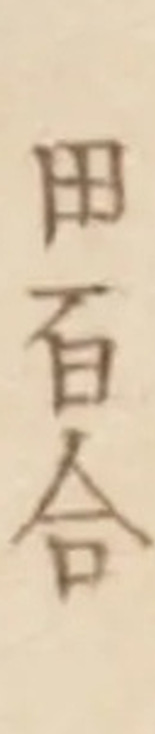田百合
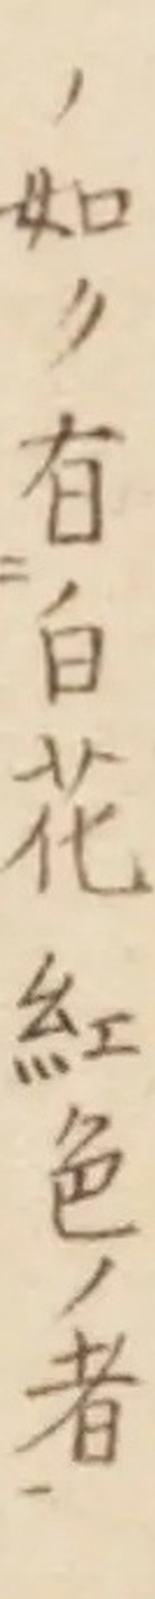ノ如ク有白花紅色ノ者
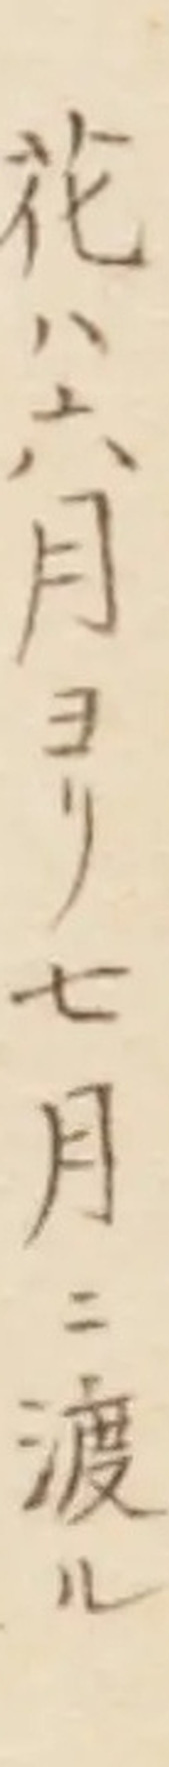花ハ六月ヨリ七月ニ渡ル
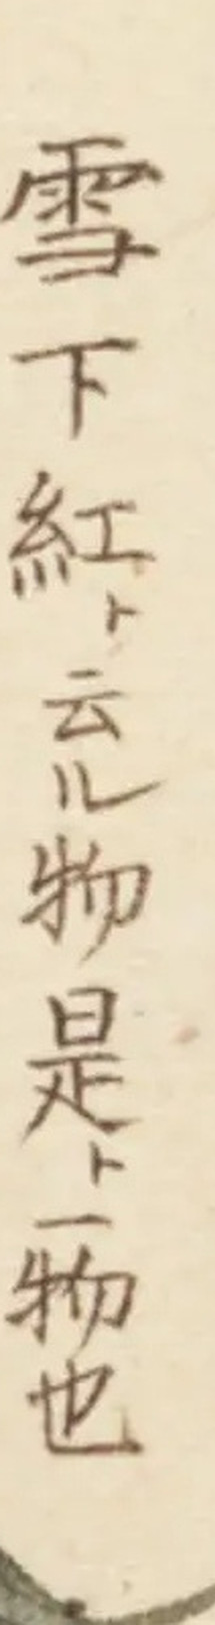雪下紅云ル物是一物也
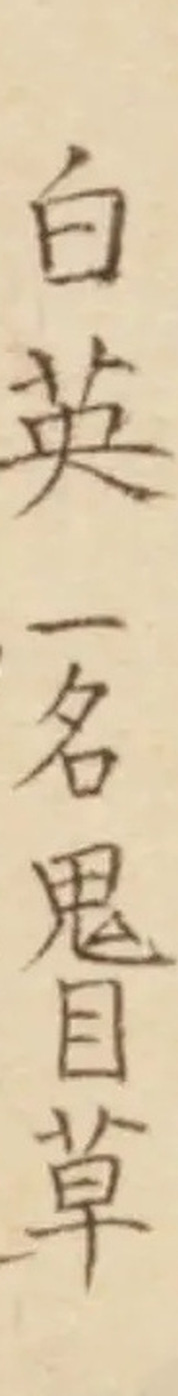白英一名鬼目草
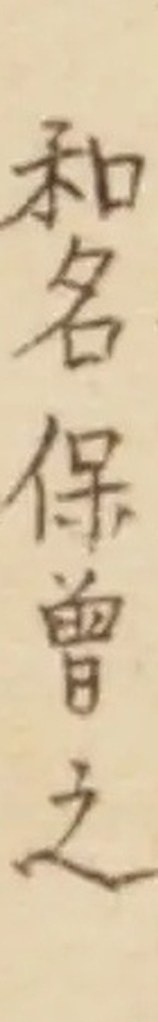和名保曽之
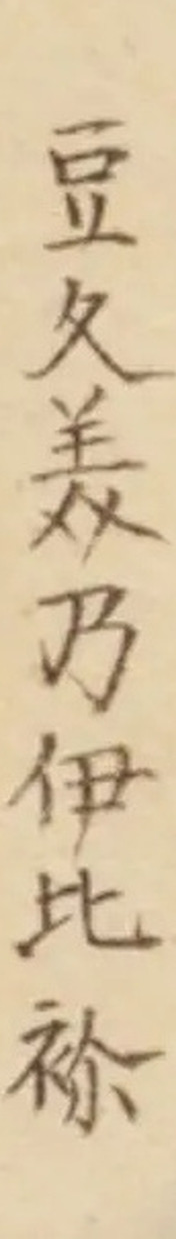豆夂美乃伊比袮
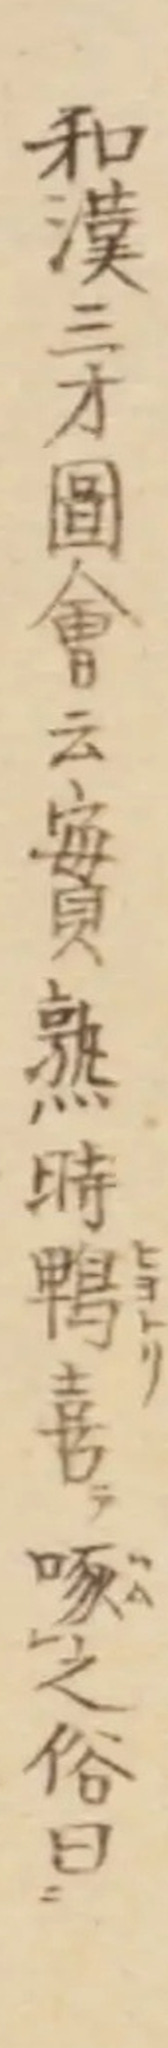和漢三才図会云実熟時鵯喜啄之俗曰
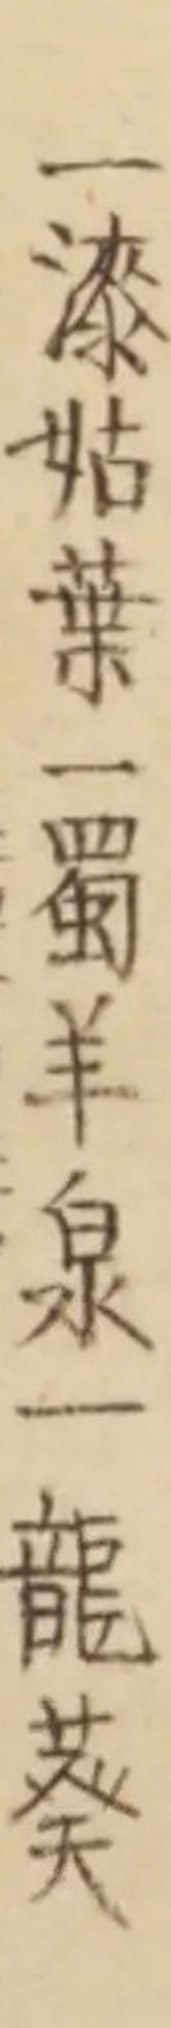一漆姑葉一蜀羊泉一竜葵

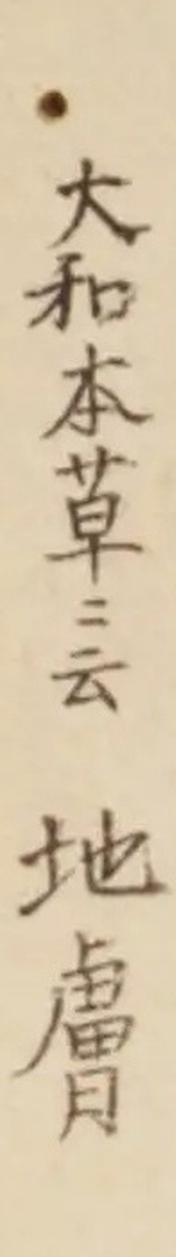大和本草ニ云地膚
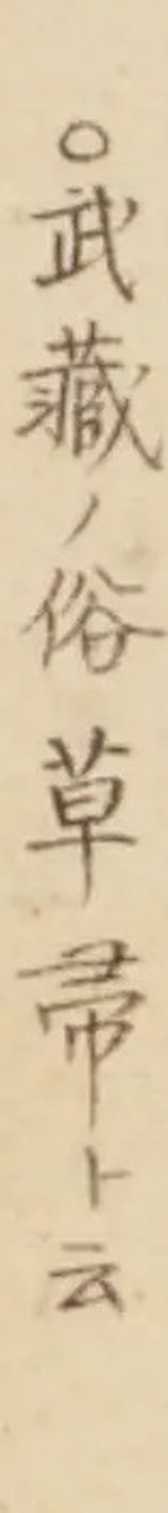○武蔵ノ俗草帚云

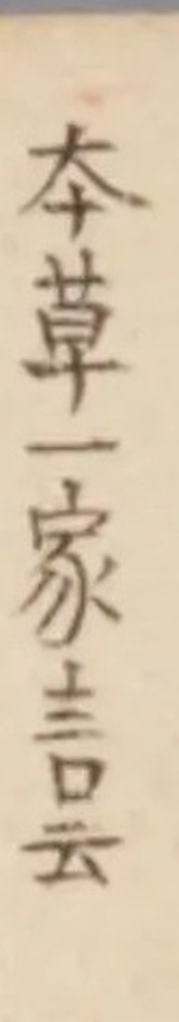本草一家言云
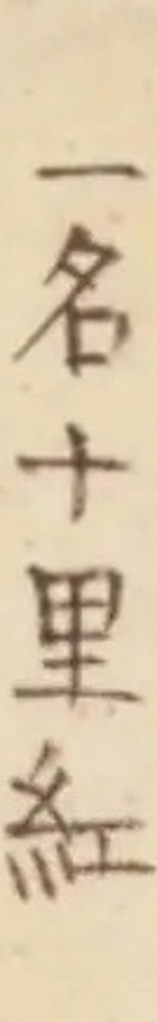一名十里紅
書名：梅園草木花譜秋之部. 2
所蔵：国立国会図書館 National Diet Library, JAPAN
